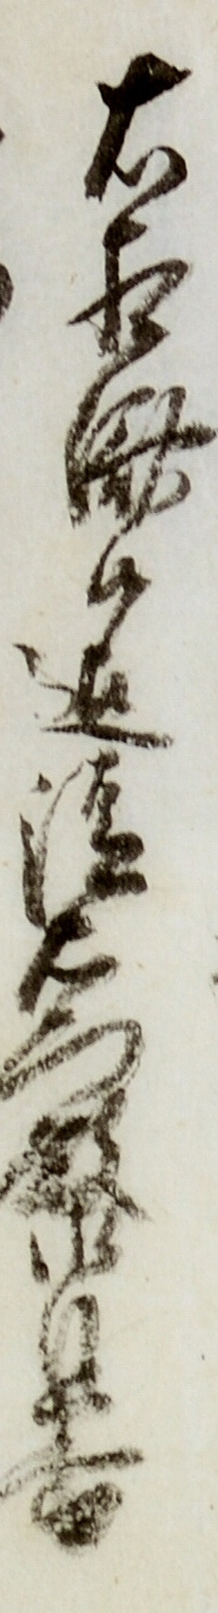右相済候迄清右衛門殿御月番
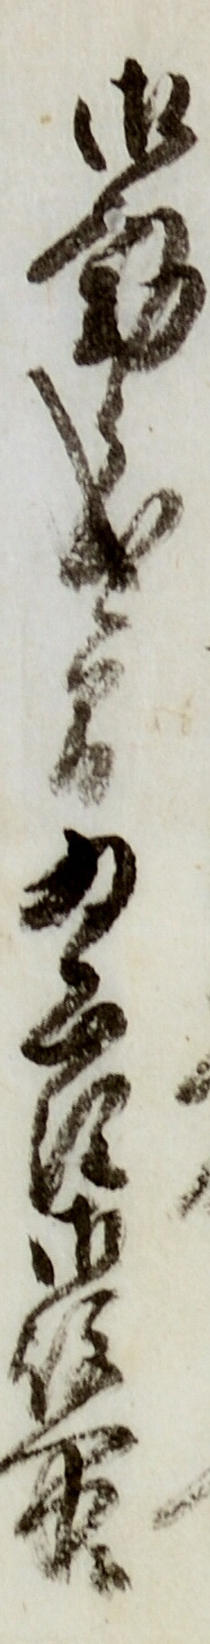御勤被成候間為心得御役所え
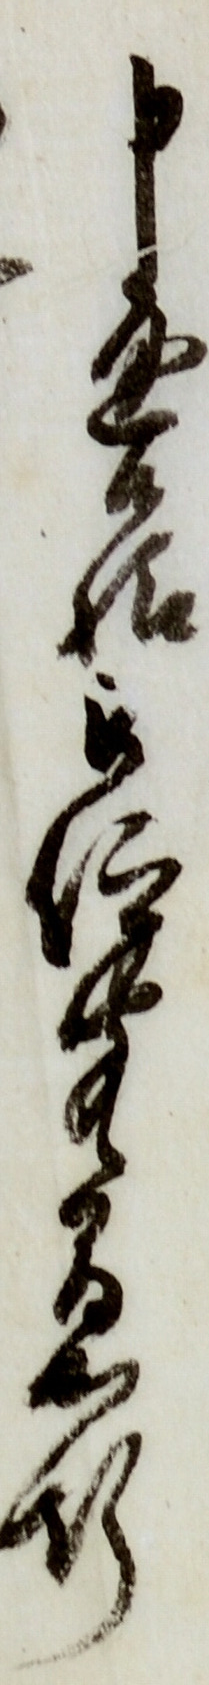申通候様被仰聞候間如斯
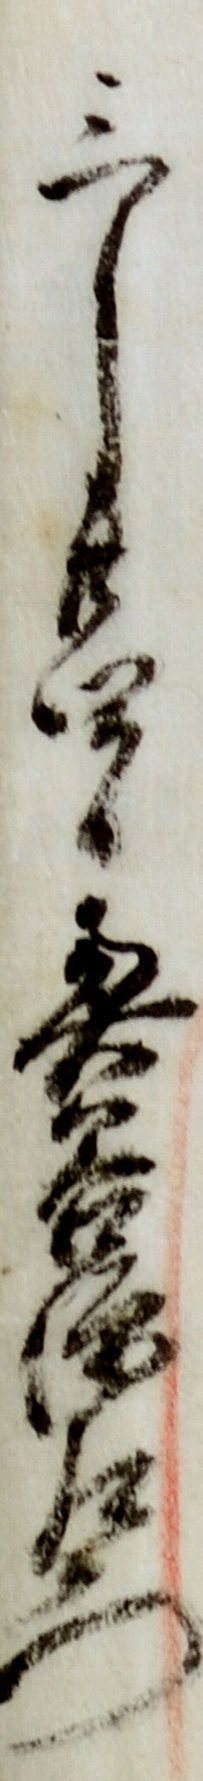三月廿四日奥谷源左衛門
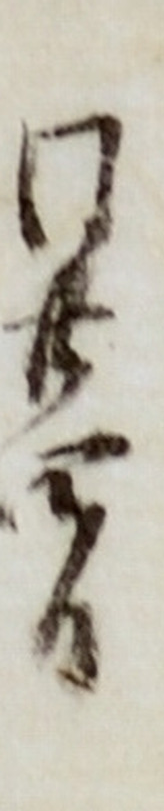同廿四日
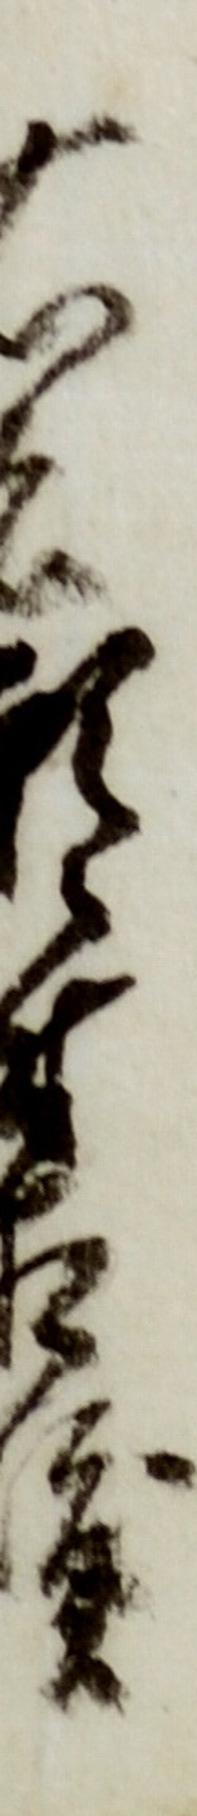右願に付相渡候

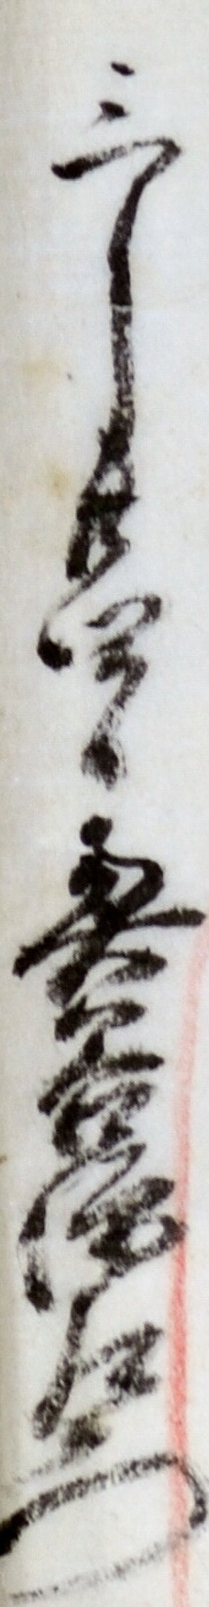三月廿四日奥谷源左衛門
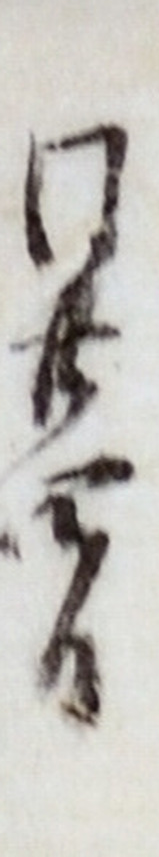同廿五日
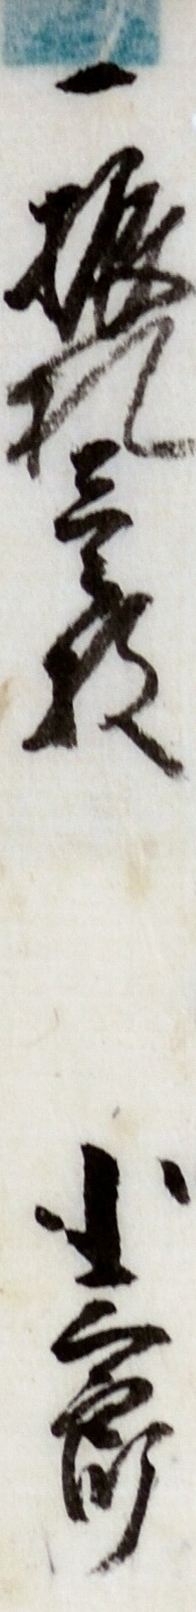一振札壱枚小三郎
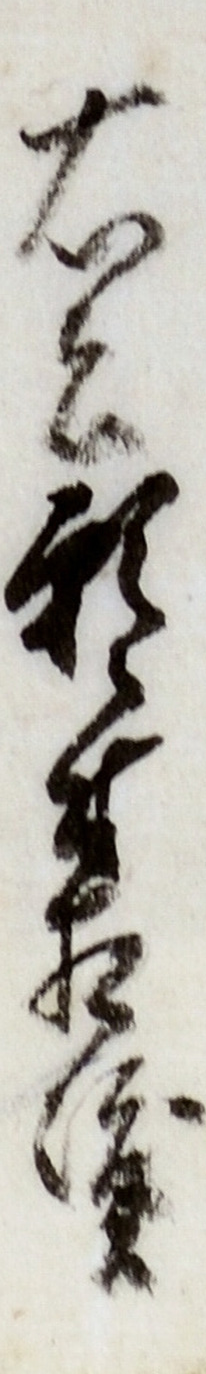右は願に付相渡候
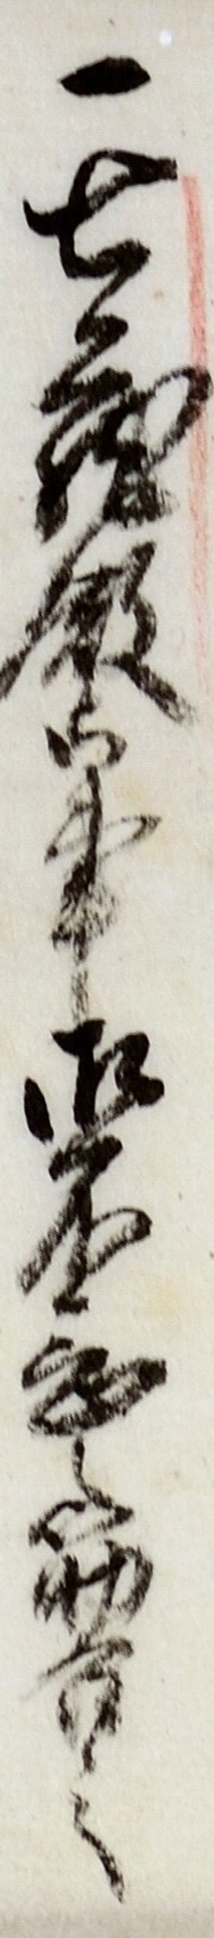一七蔵殿御事御不念之筋有之
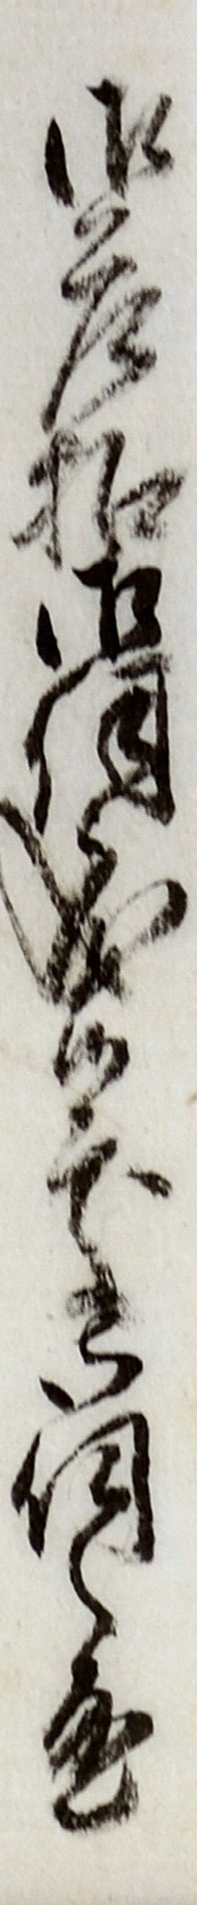御差扣御伺被成候処御伺之通
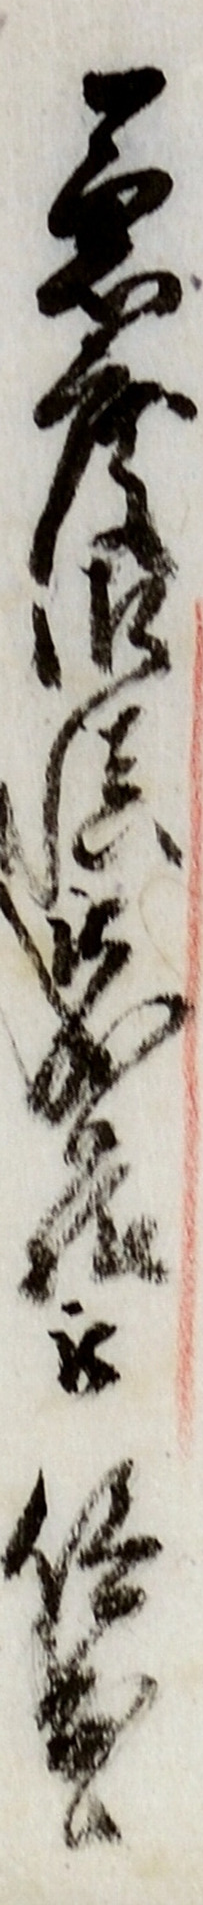急度御慎被成候様被仰出候
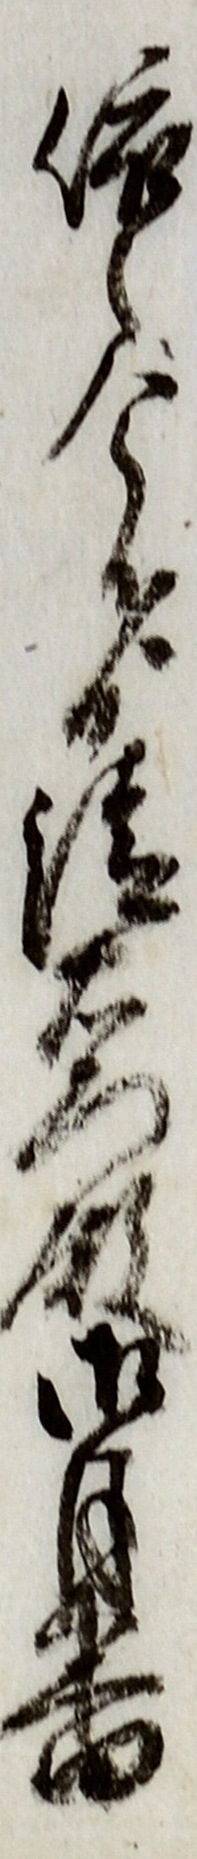依之今日より清右衛門殿御月番
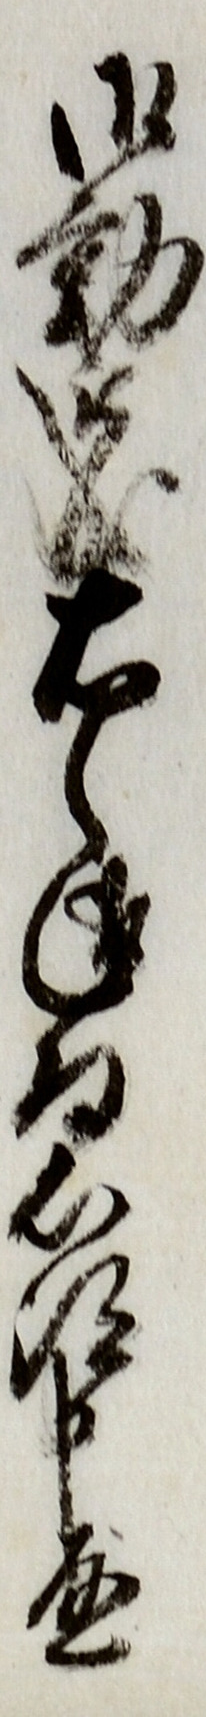御勤被成右之趣為心得申通
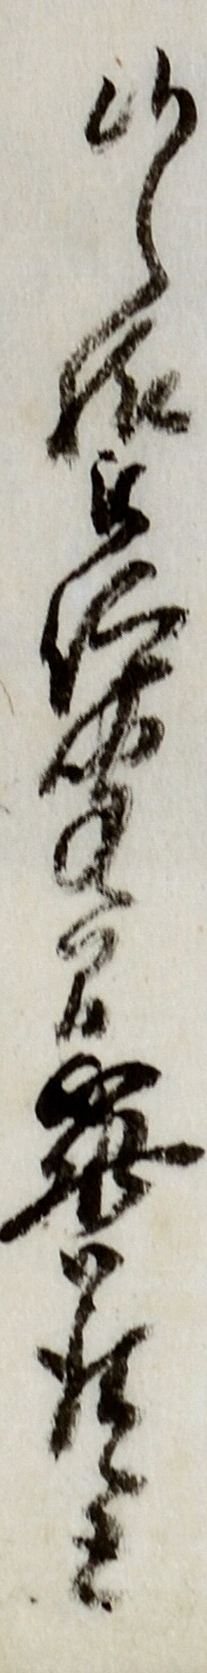候之様被仰聞候間如此御座候以上
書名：諸事御用留帳
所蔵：伊那市立高遠町図書館・合同会社AMANE
